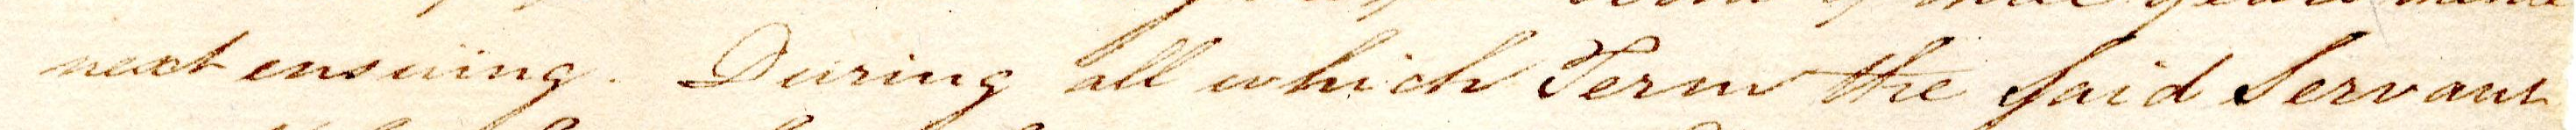next ensuing. During all which Term the said Servant
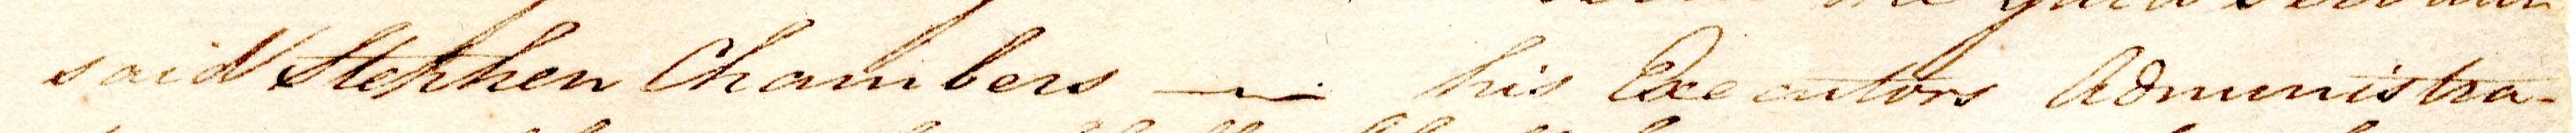said Stephen Chambers - his Execution Administra-
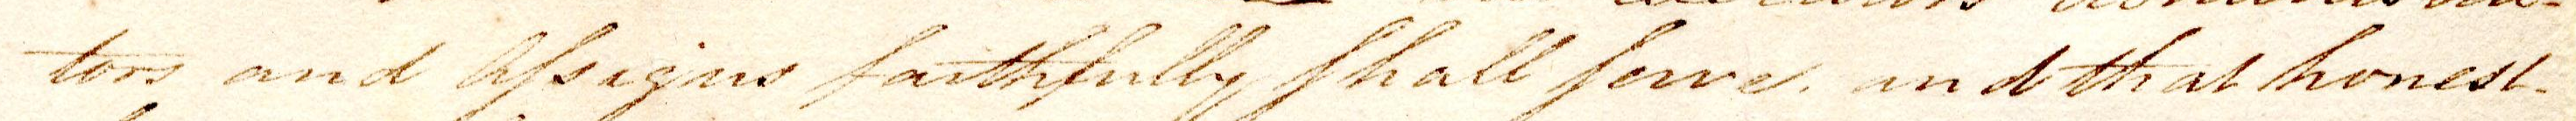-tors and assigns faithfully shall serve, and that honest-
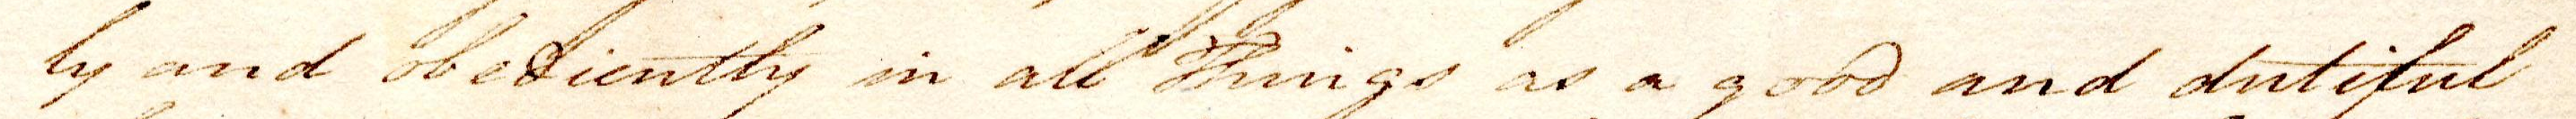-ly and obediently in all Things as a good and dutiful
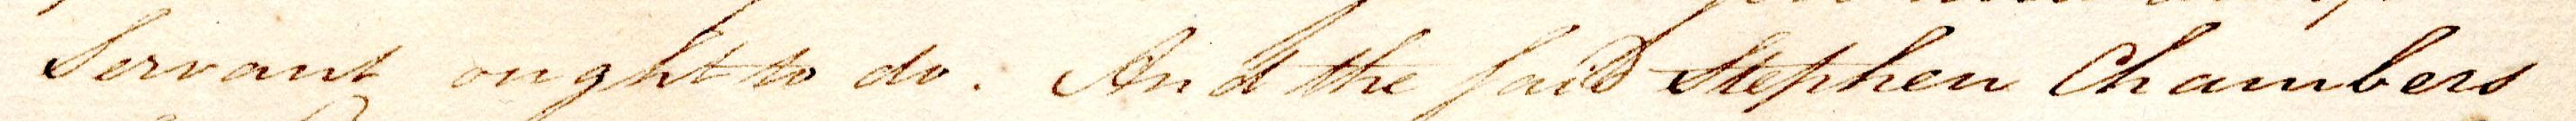Servant ought to do. And the said Stephen Chambers
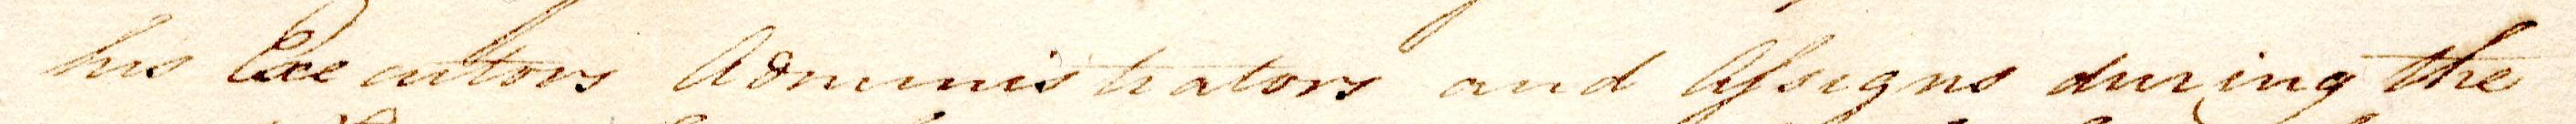his Executors Administrators and Assigns during the
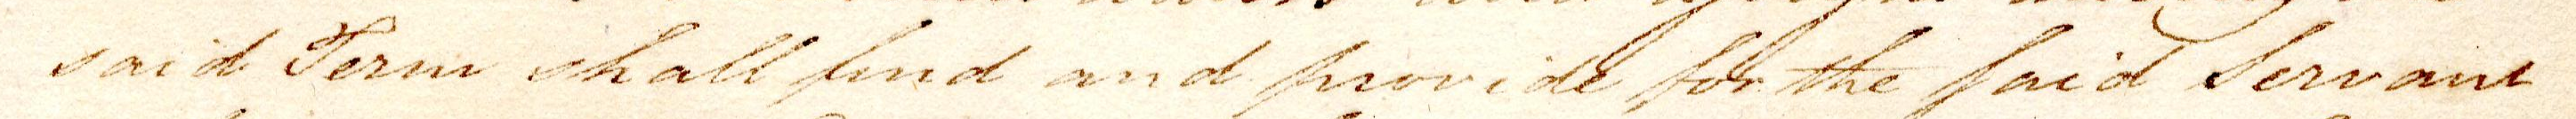said Term shall find and provide for the said Servant
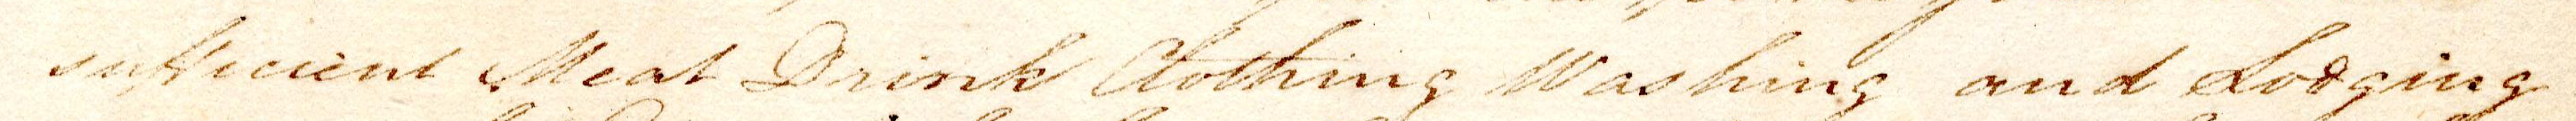sufficient Meat Drink Clothing Washing and Lodging
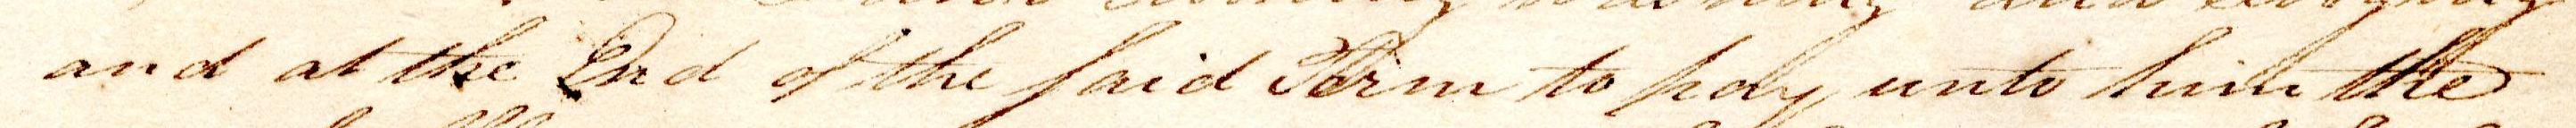and at the End of the said Term to pay unto him the
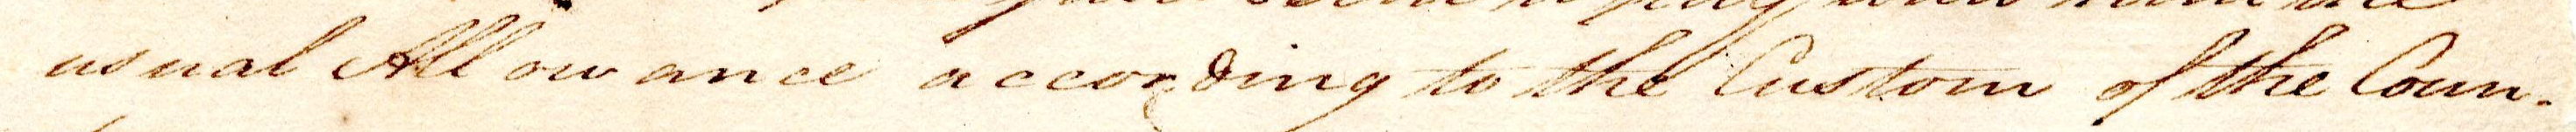usual Allowance according to the Custom of the Coun-
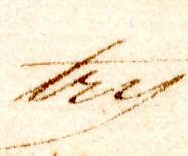try.
